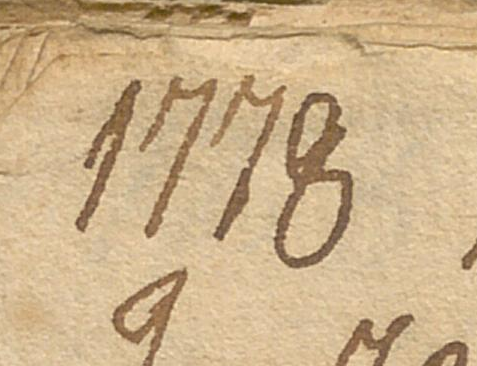1778
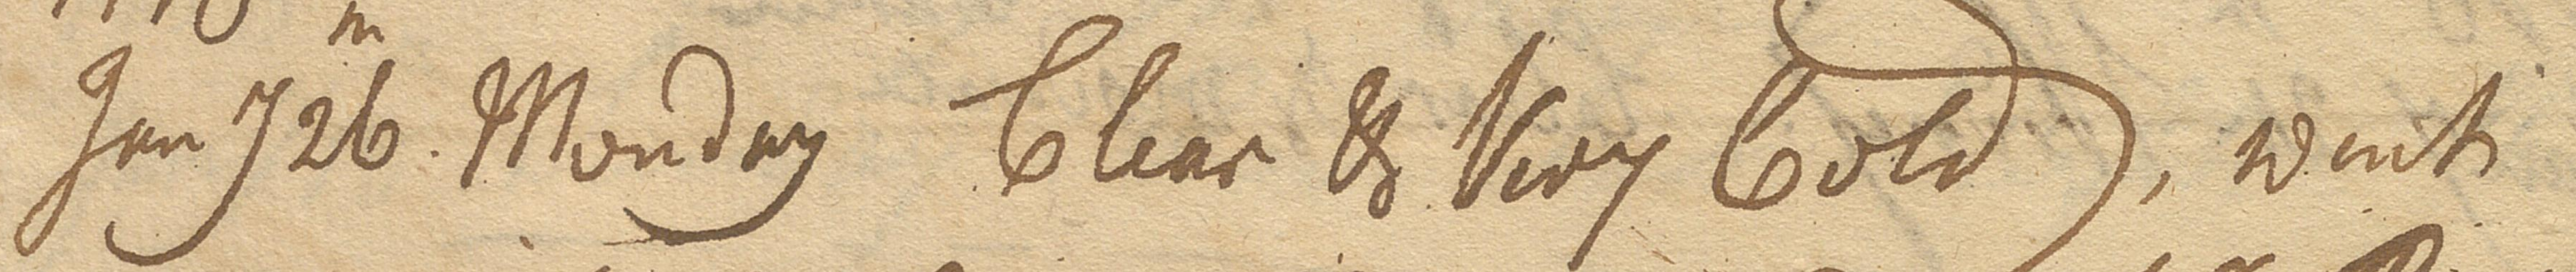Jan^y 26. Monday Clear & Very Cold, went
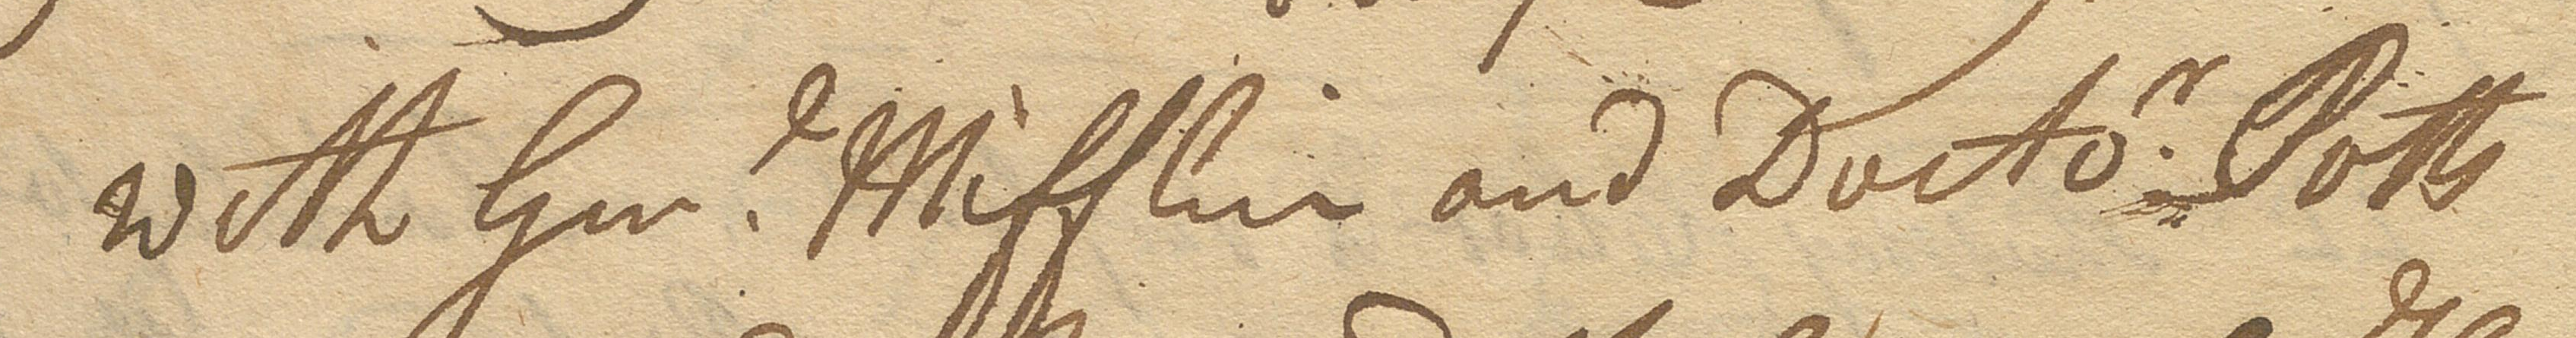with Gen^l. Mifflin and Docto^r. Potts
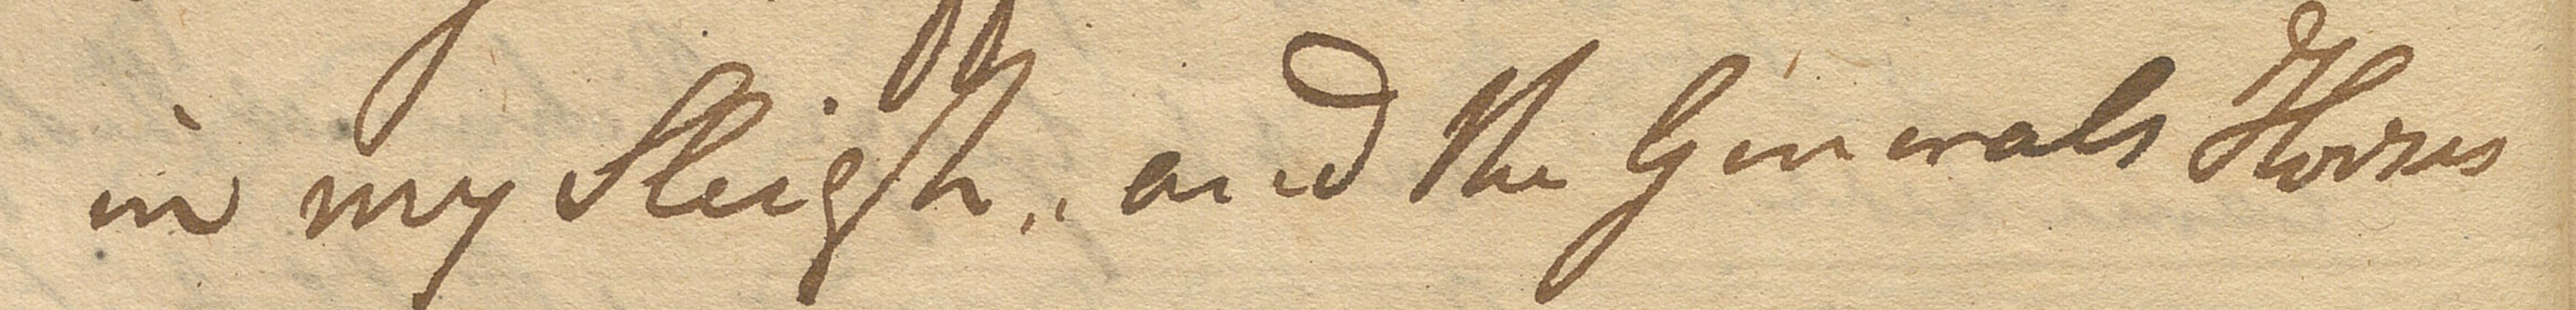in my Sleigh, and the Generals Horses
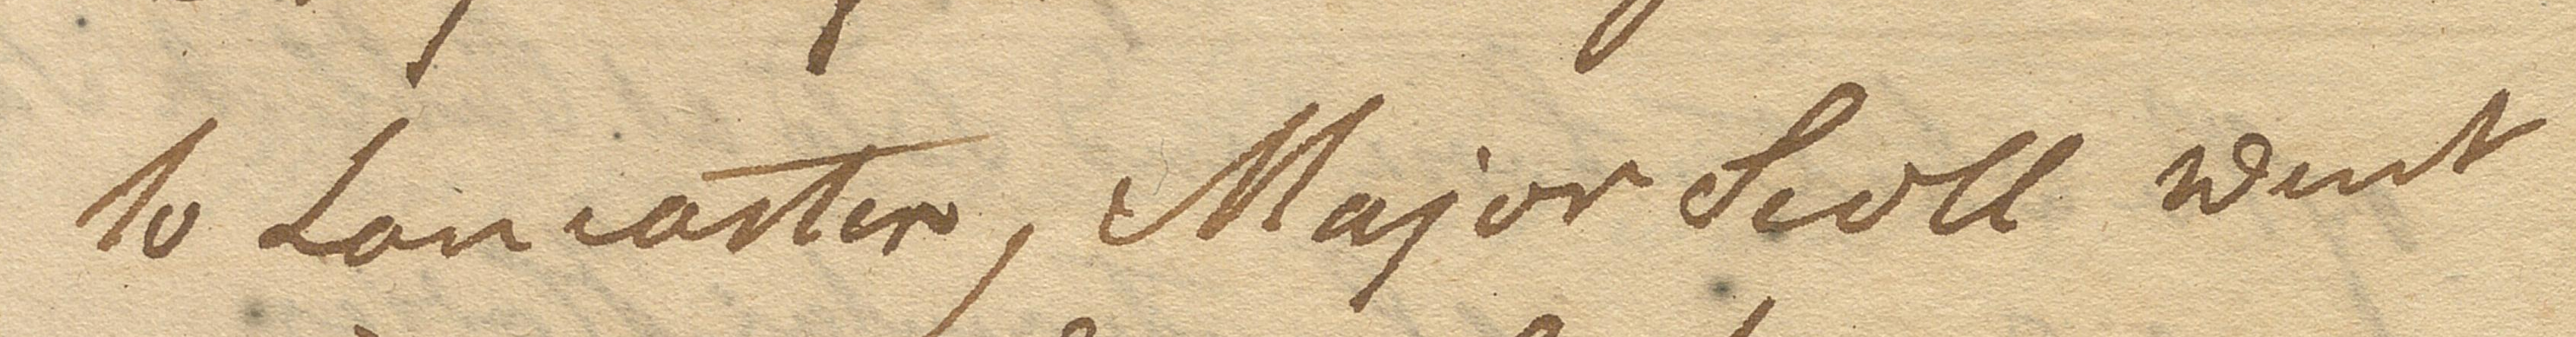to Lancaster, Major Scoll went
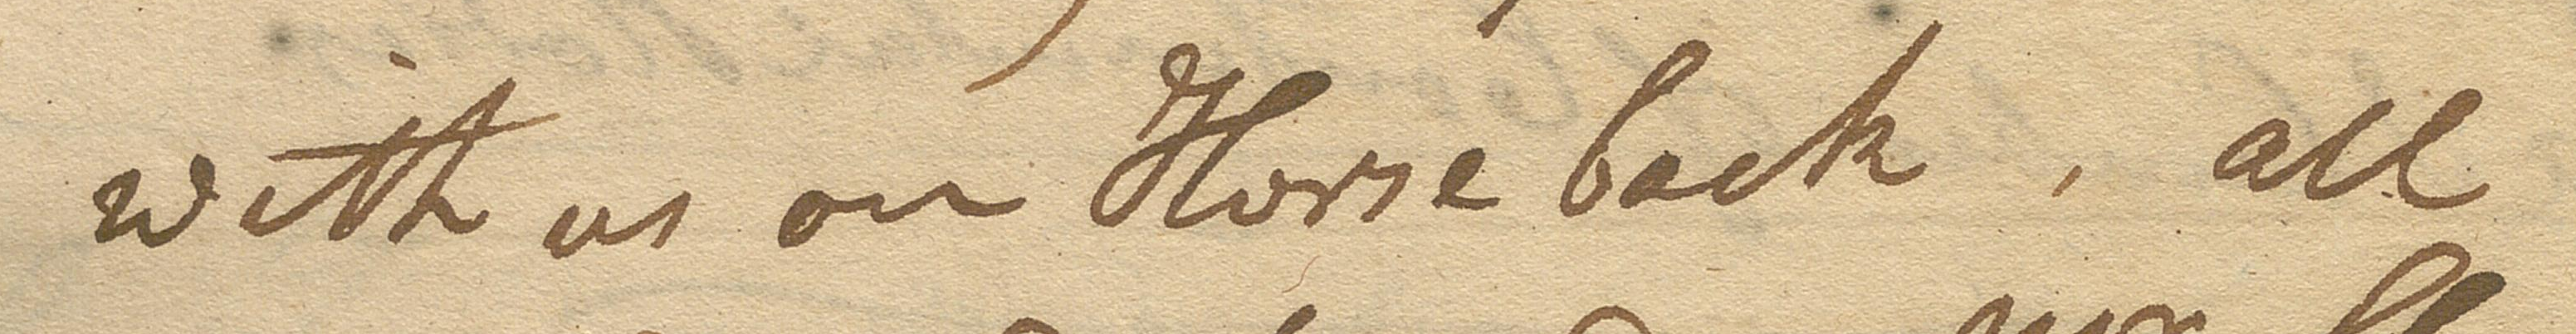with us on Horse back, all
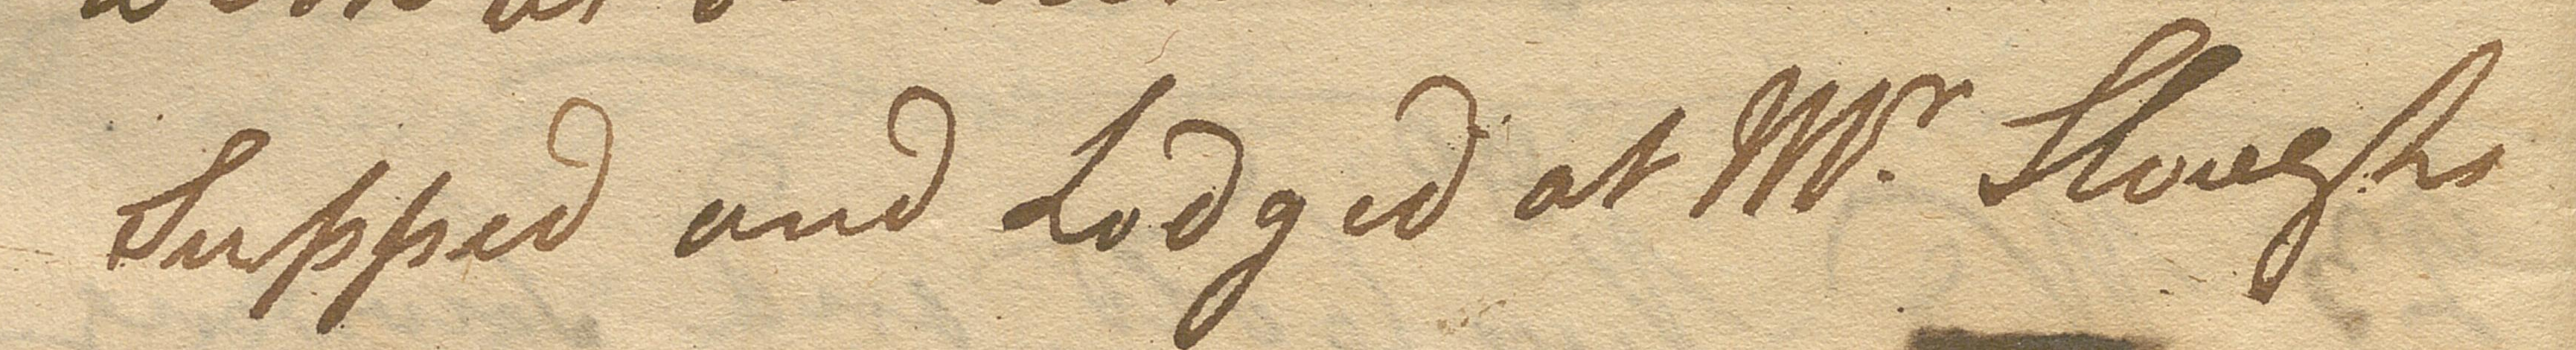Supped and Lodged at M^r. Sloughs
